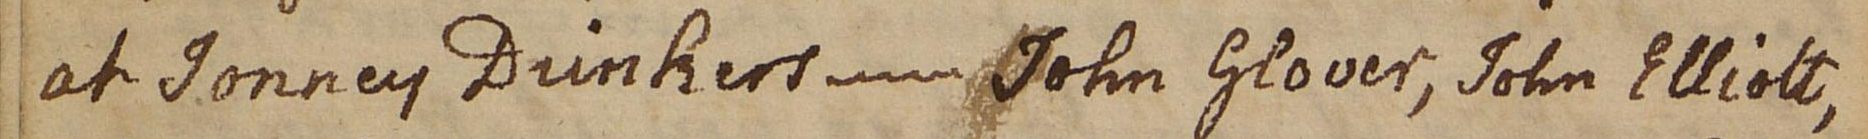at Jonney Drinkers- John Glover, John Elliott,
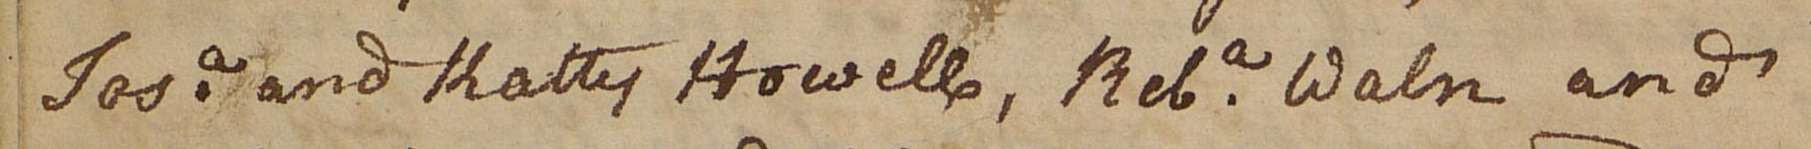Jos^a. and Katty Howell, Reb^a. Waln and
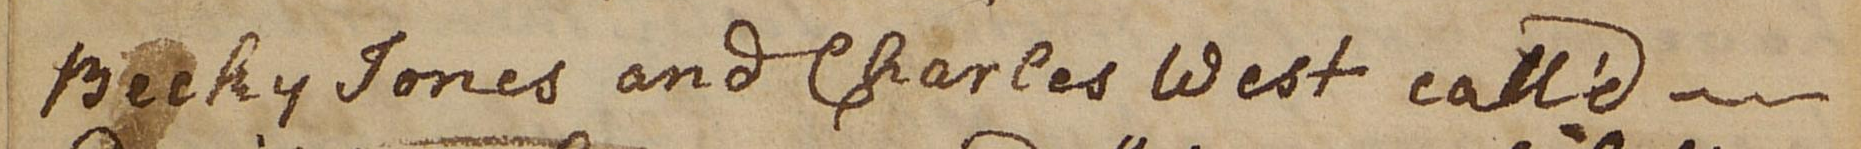Becky Jones and Charles West call'd-
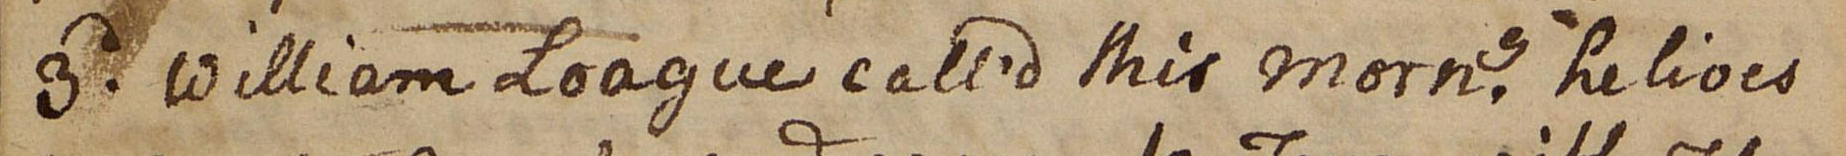3^d. William Loague call'd this morn^g. he lives
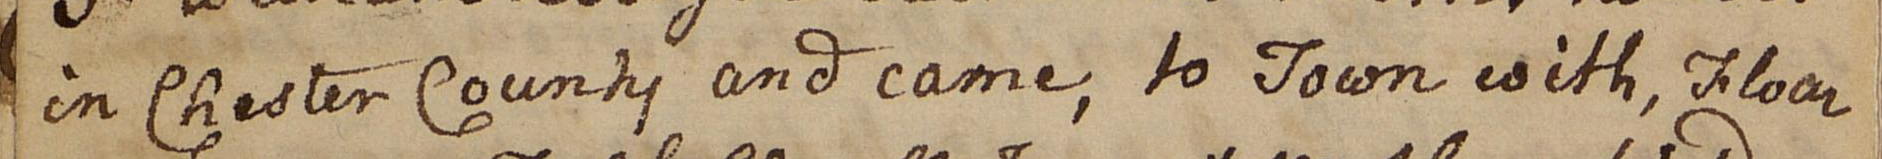in Chester County and came, to Town with, Flour
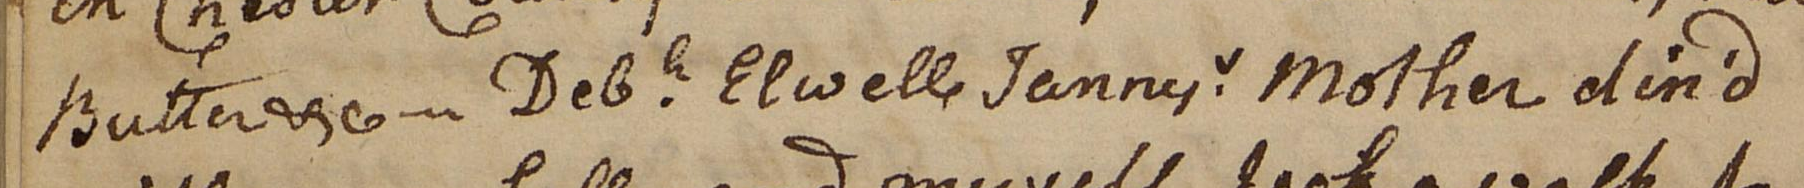Butter &c- Deb^h. Elwell Janny^s. Mother din'd
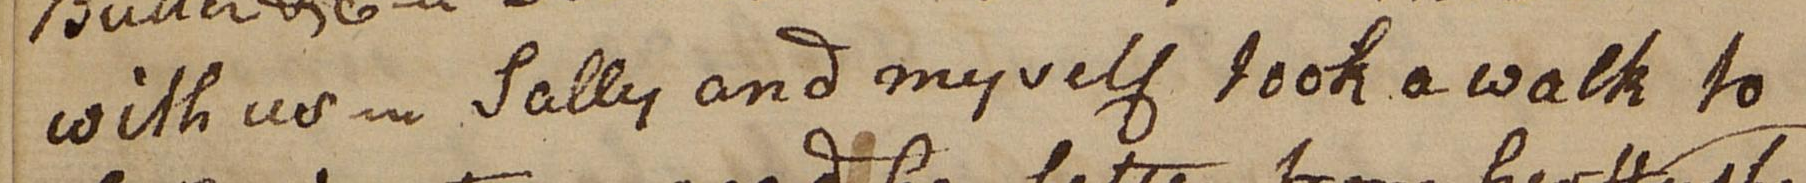with us - Sally and myself took a walk to
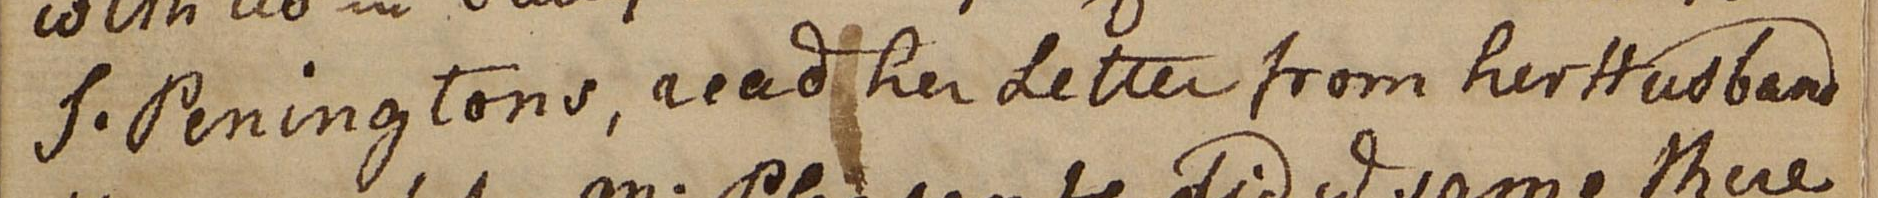S. Peningtons, read her Letter from her husband
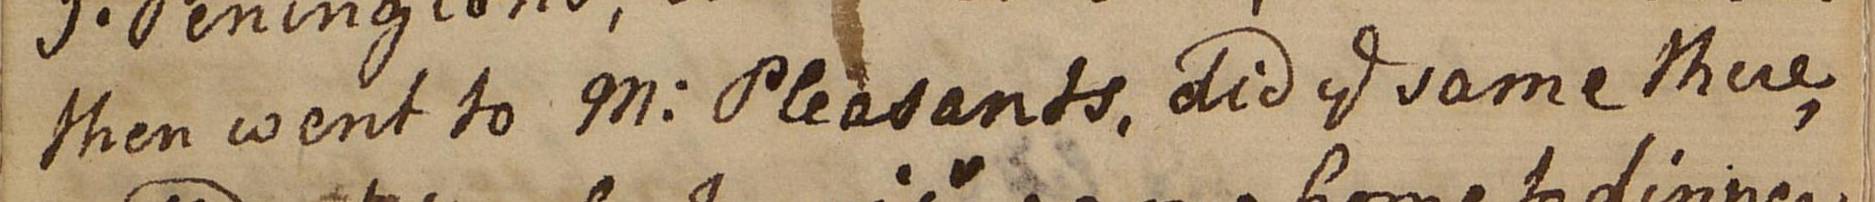then went to M: Pleasants, did y^e same there,
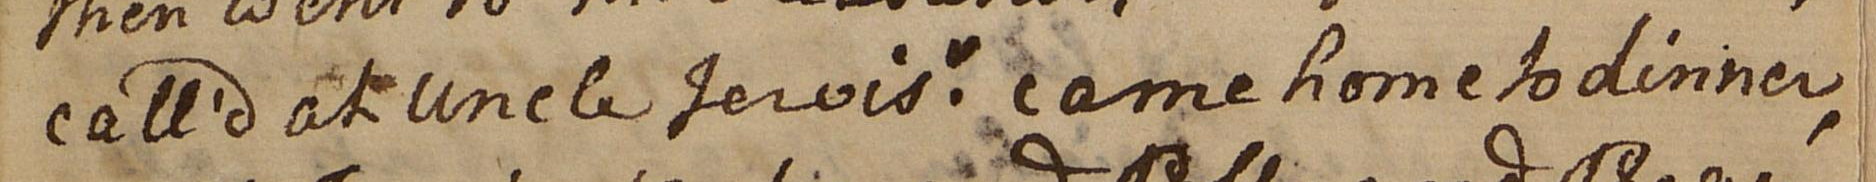call'd at Uncle Jervis^s. came home to dinner,
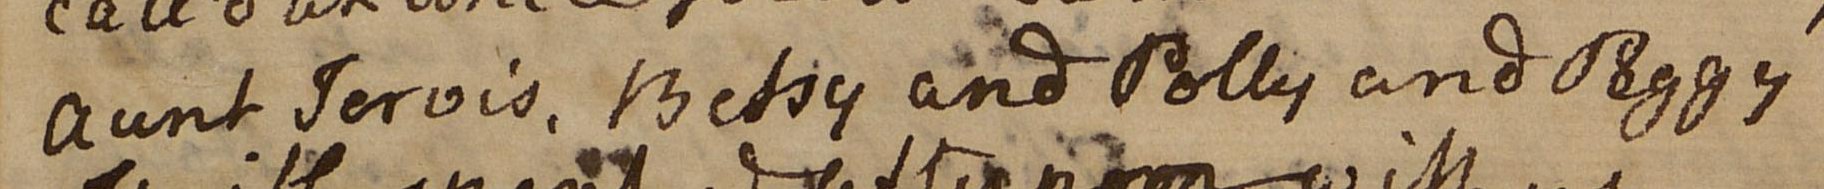Aunt Jervis, Betsy and Polly and Peggy
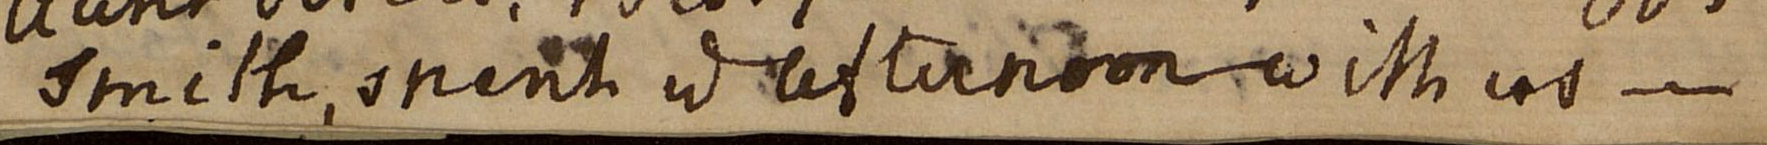Smith, spent y^e afternoon with us-
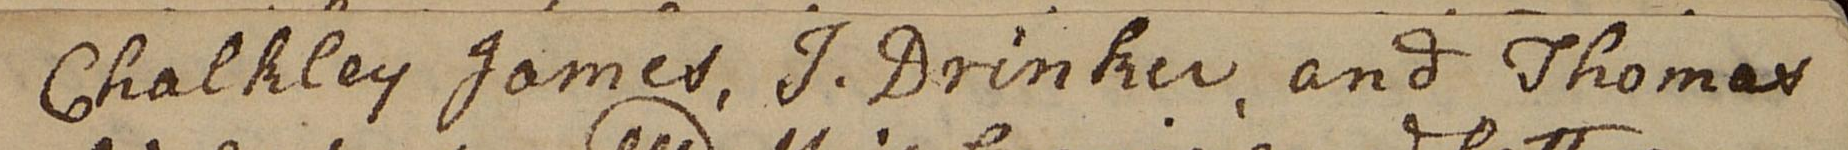Chalkley James, I. Drinker, and Thomas
